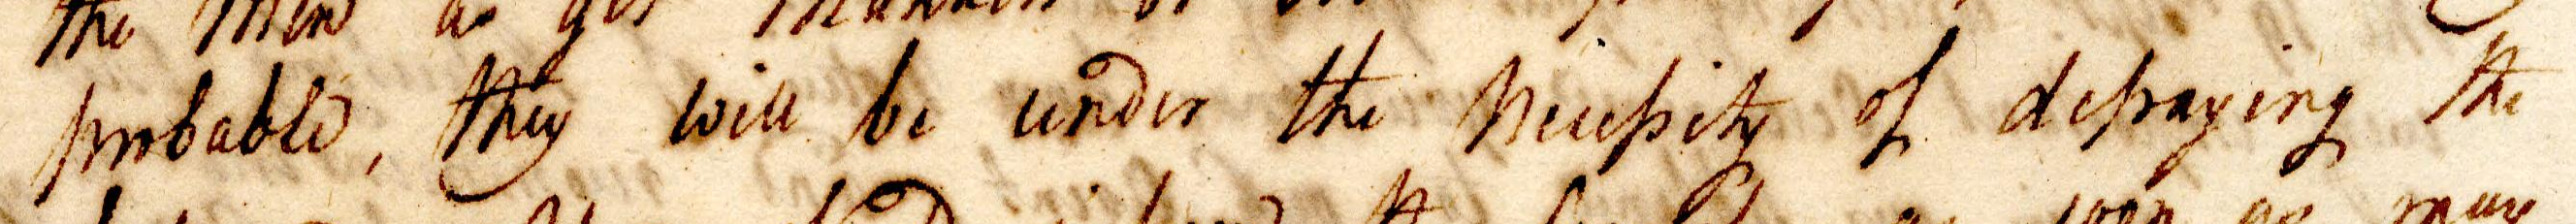probable, they will be under the Necessity of repaying the
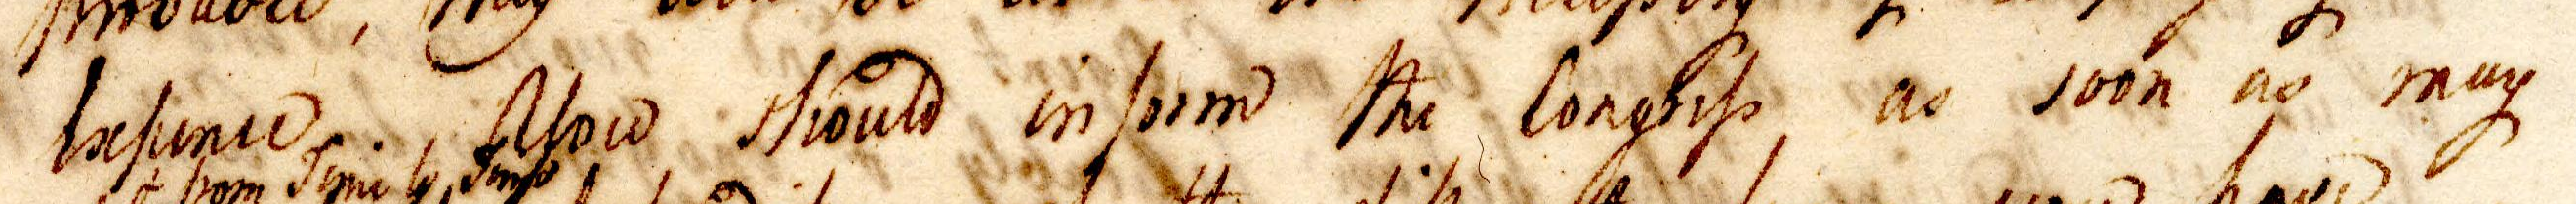Expence. You should inform the Congress as soon as may
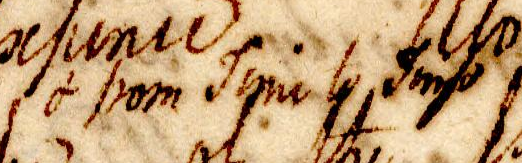& from Time to Time
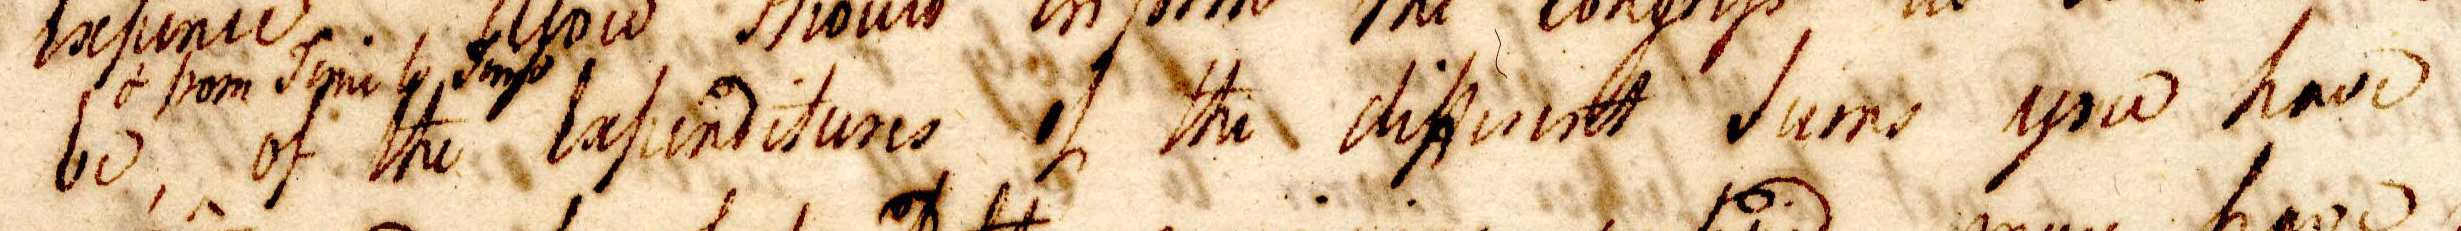be ^ of the Expenditures of the different Sums you have
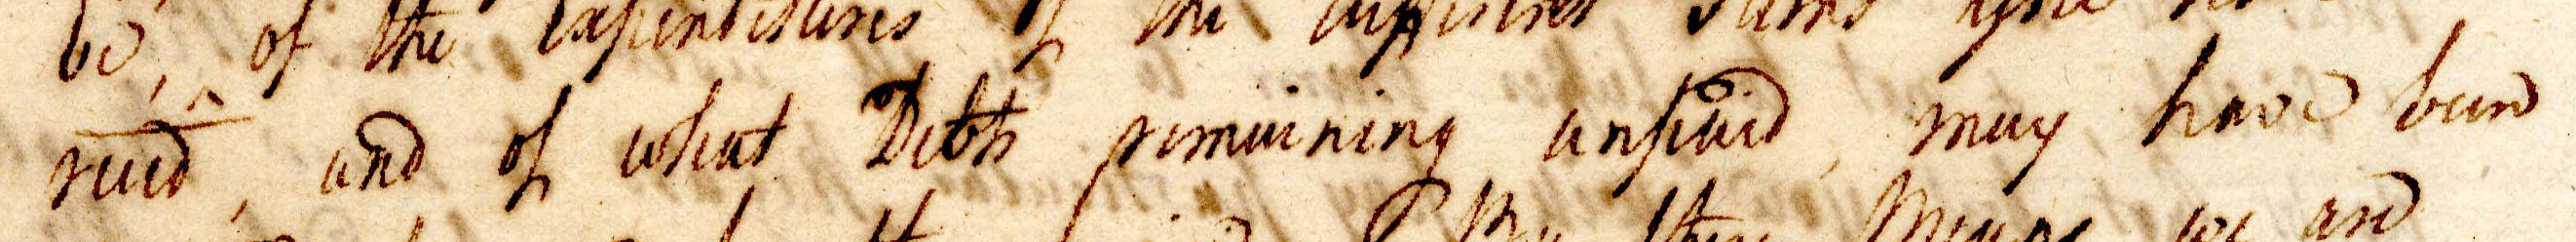rued, and of what Debts remaining unpaid may have been
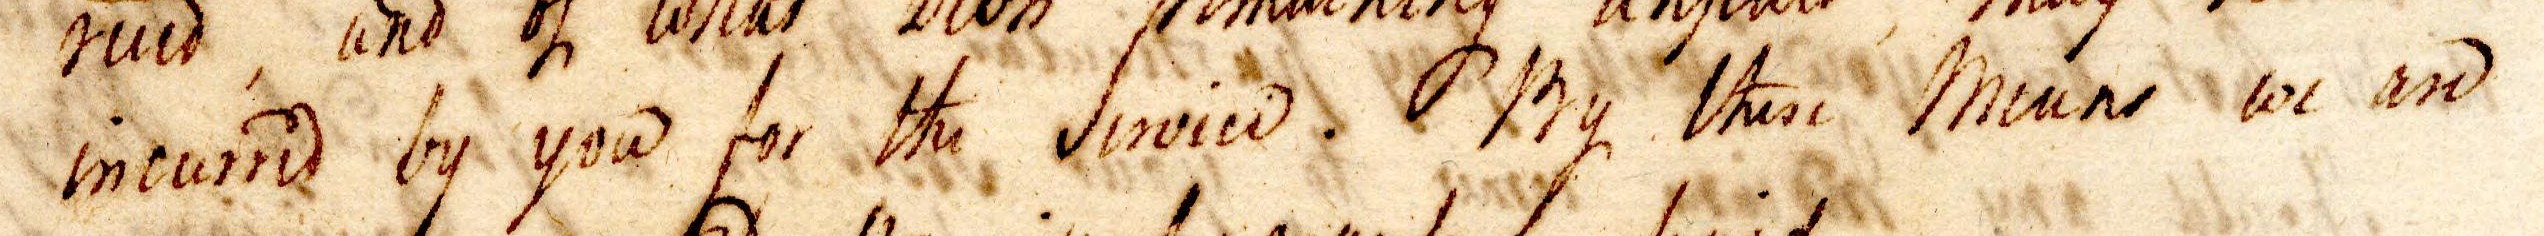incurred by you for the Service. By these Means we are
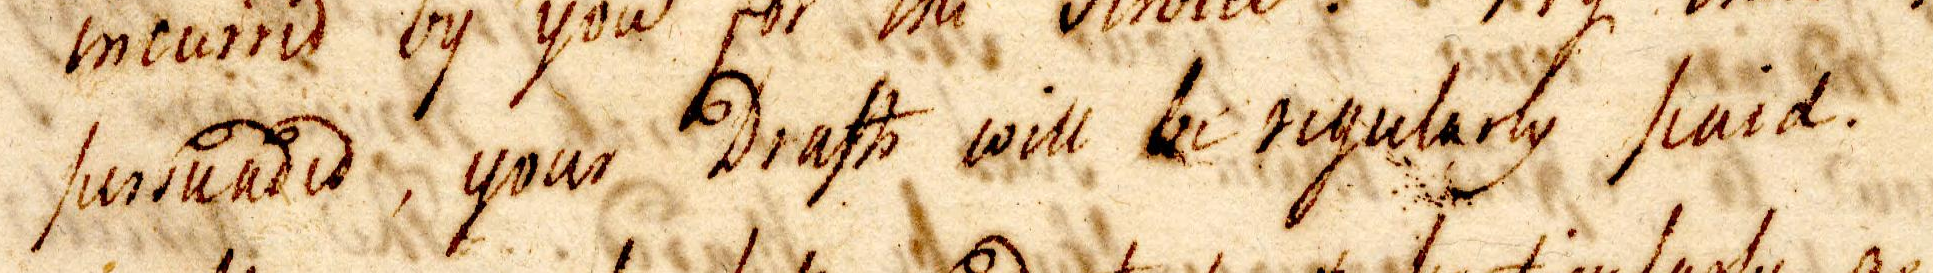persuaded your Drafts will be regularly paid.
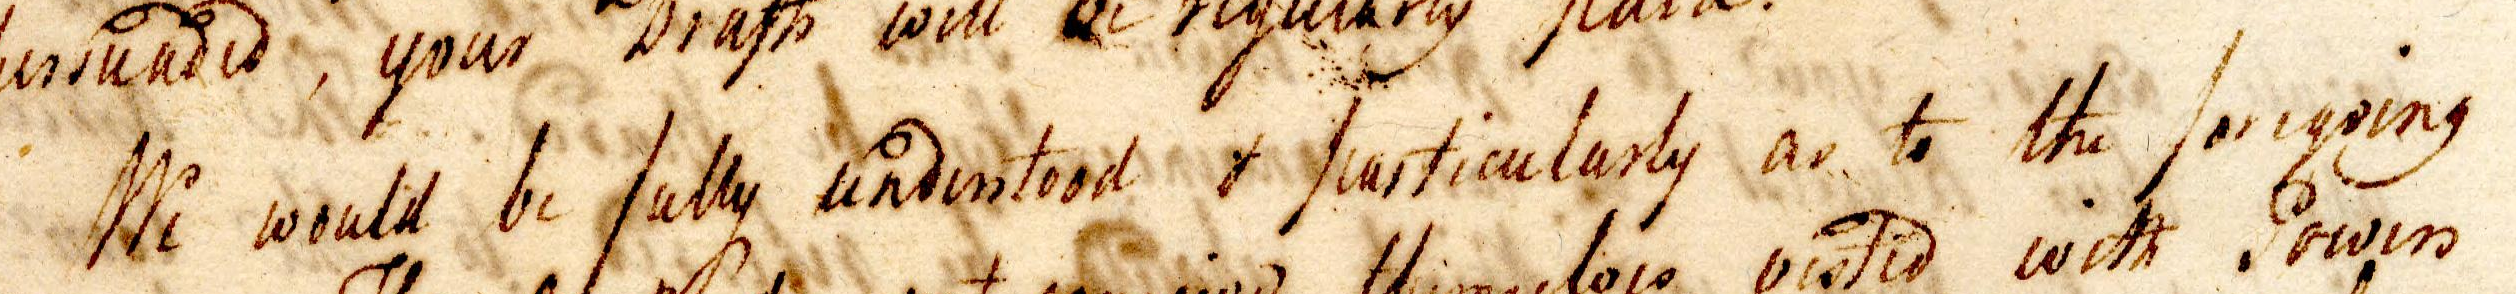We would be fully understood & particularly as to the foregoing
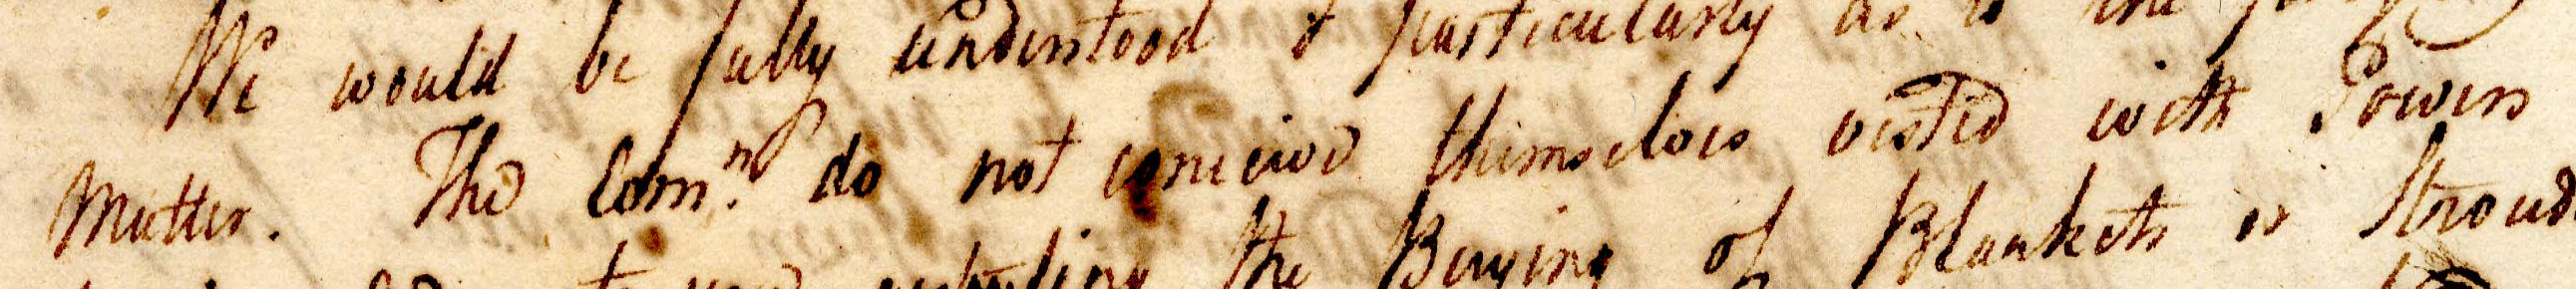Matter. The Com^n. do not conceive themselves vested with Powers
